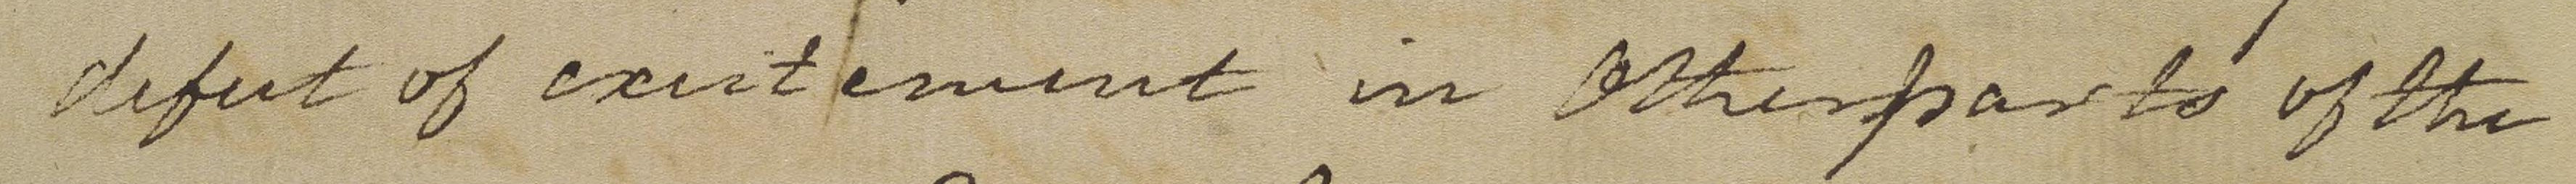defect of excitement in other parts of the
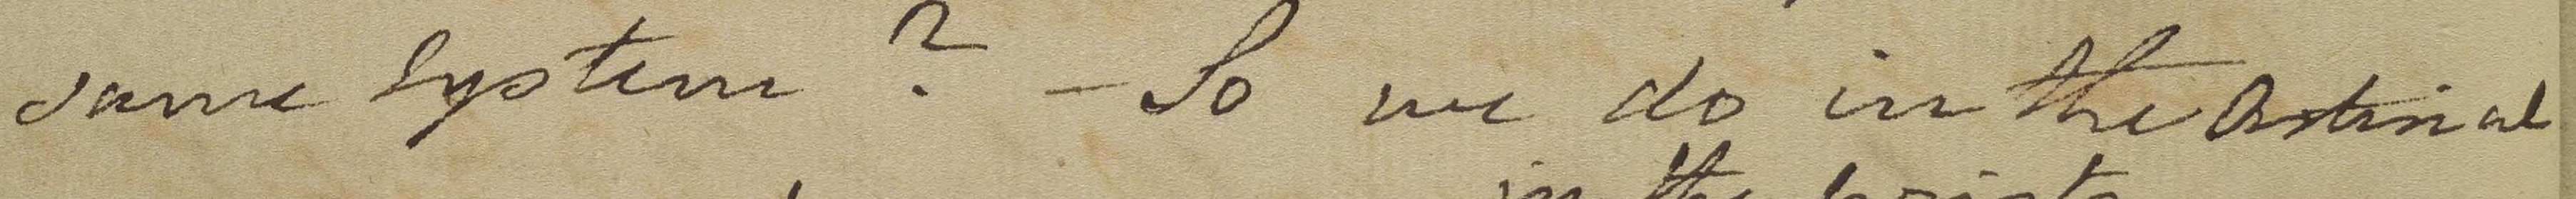same system? So we do in the arterial
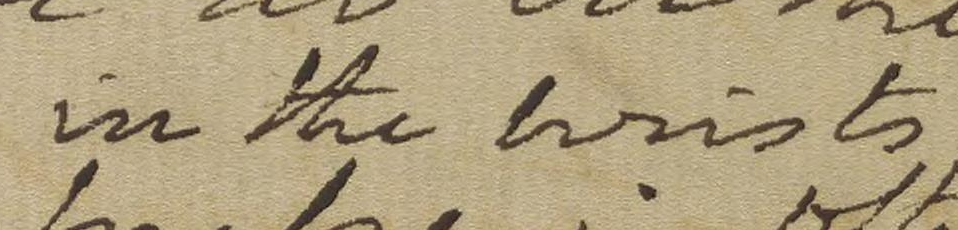in the wrists
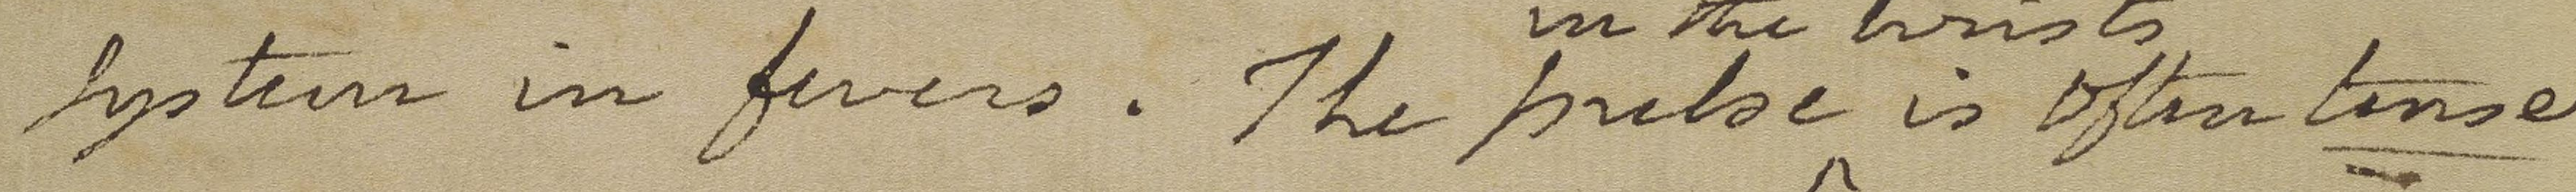system in fevers. The pulse ^ is often tense
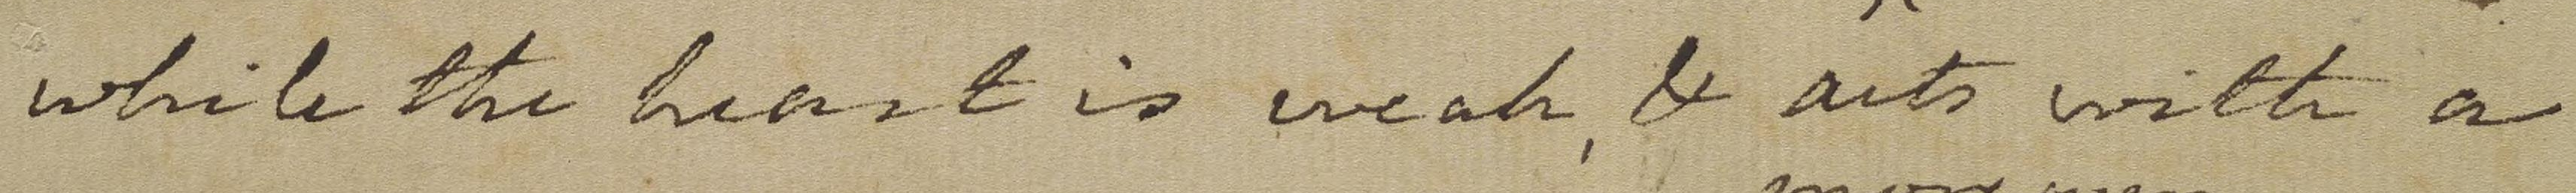while the heart is weak, & acts with a
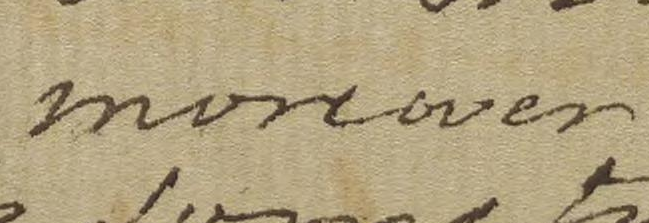moreover
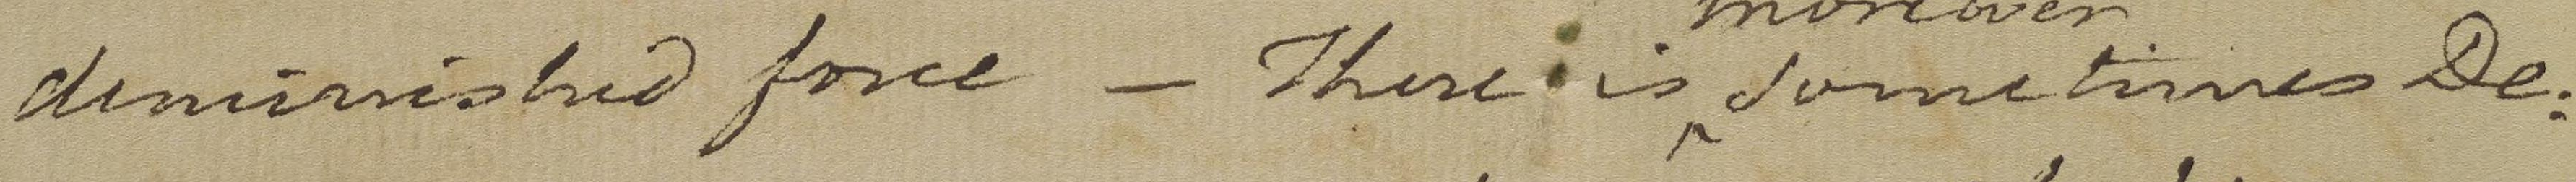diminished force. There is ^ sometimes De-
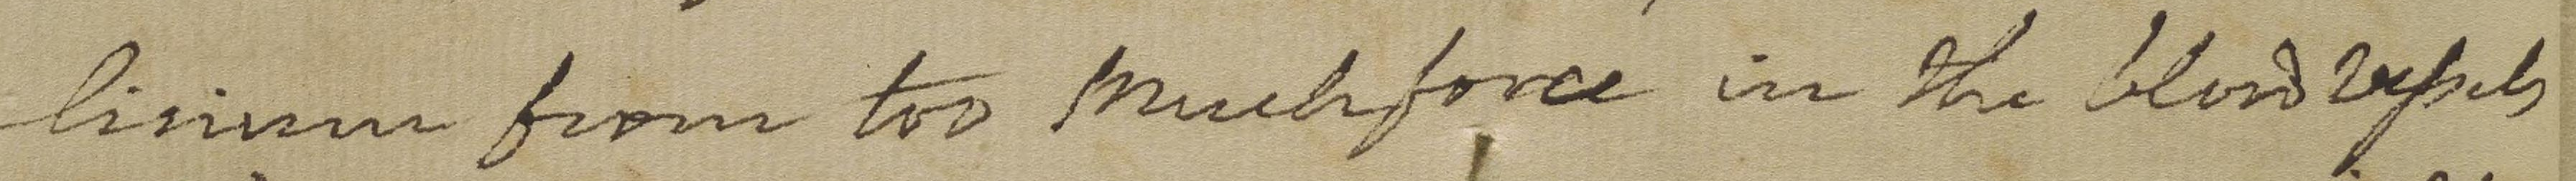-lirium from too much force in the blood vessels
